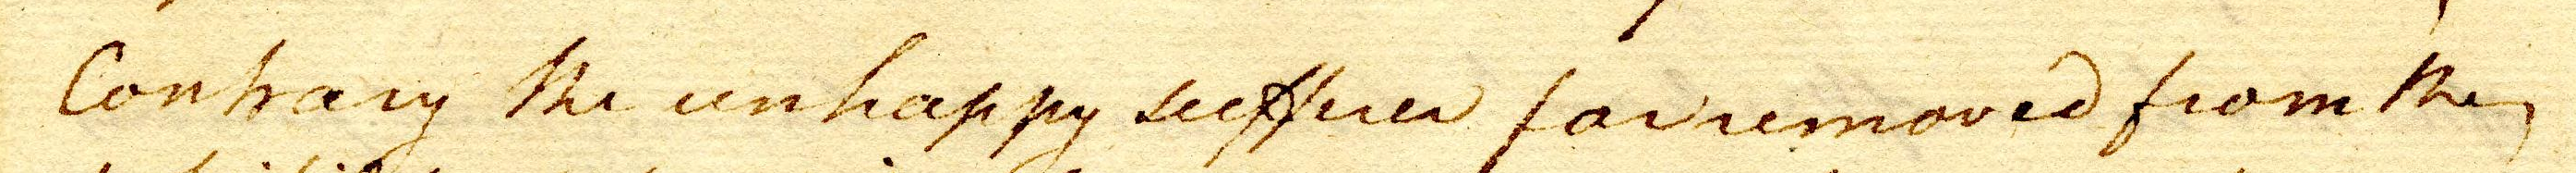Contrary the unhappy sufferer far removed from the
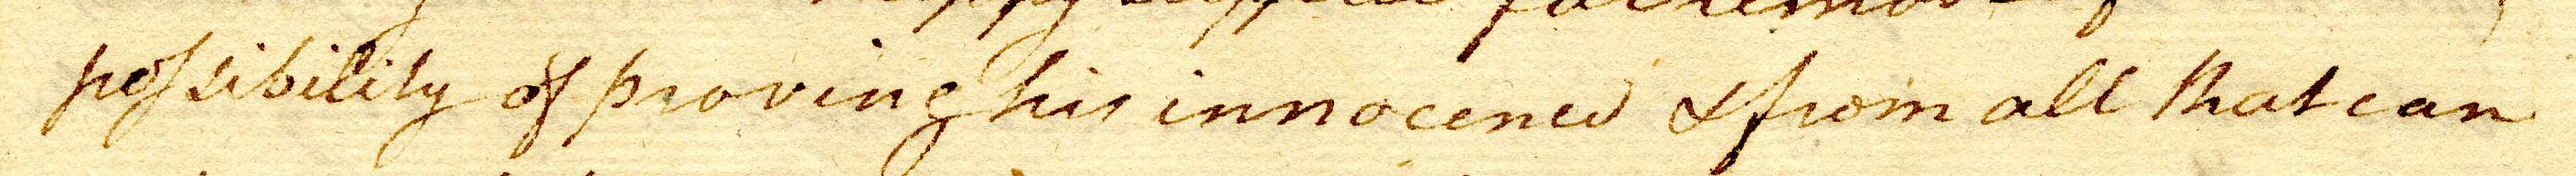possibility of proving his innocence & from all that can
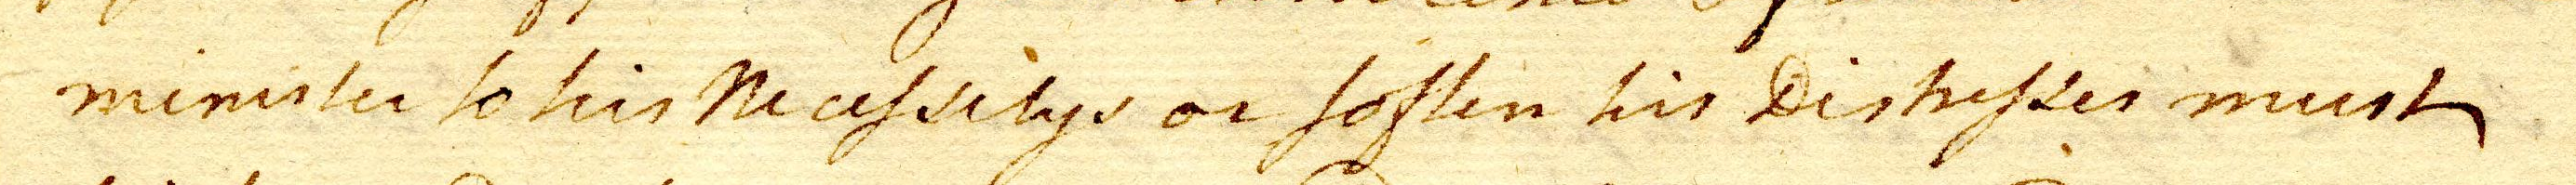minister to his Necessitys or soften his Distresses must
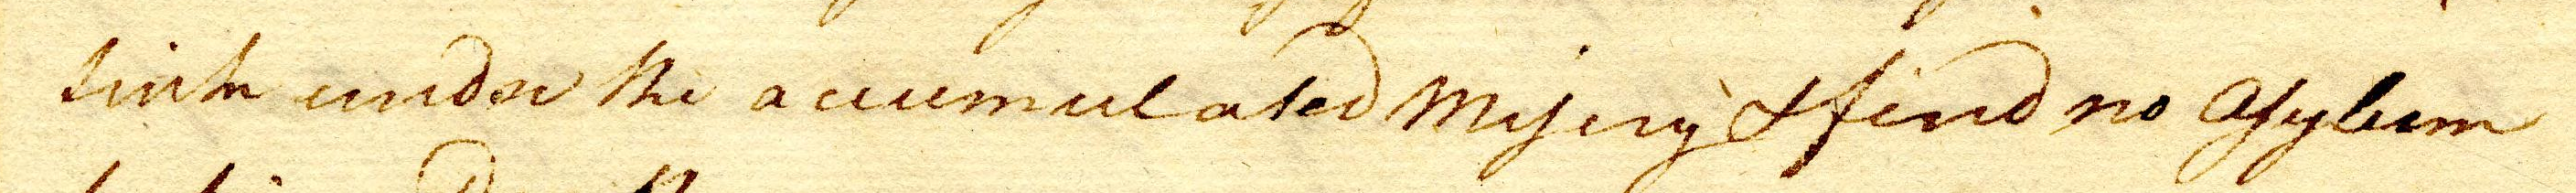sink under the accumulated Misery & find no Asylum
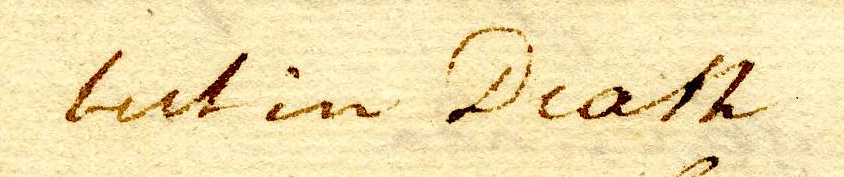but in Death
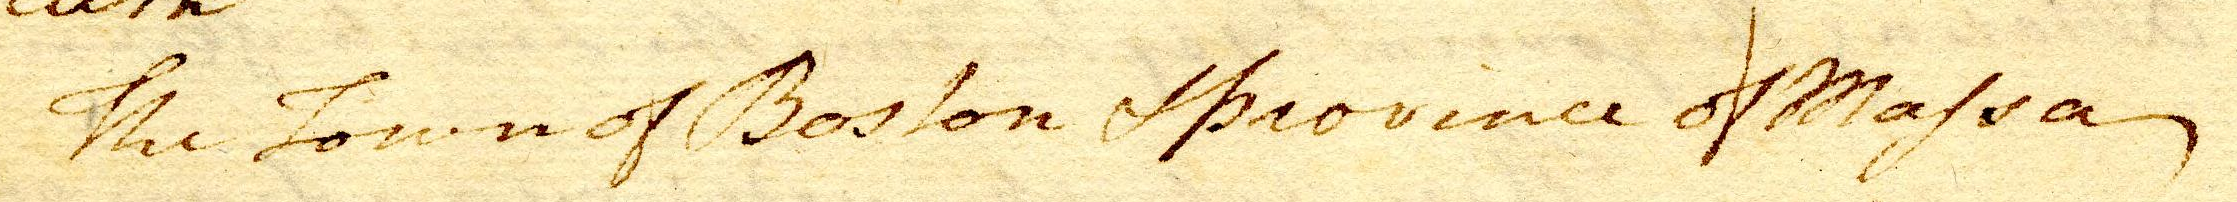The Town of Boston & Province of Massa
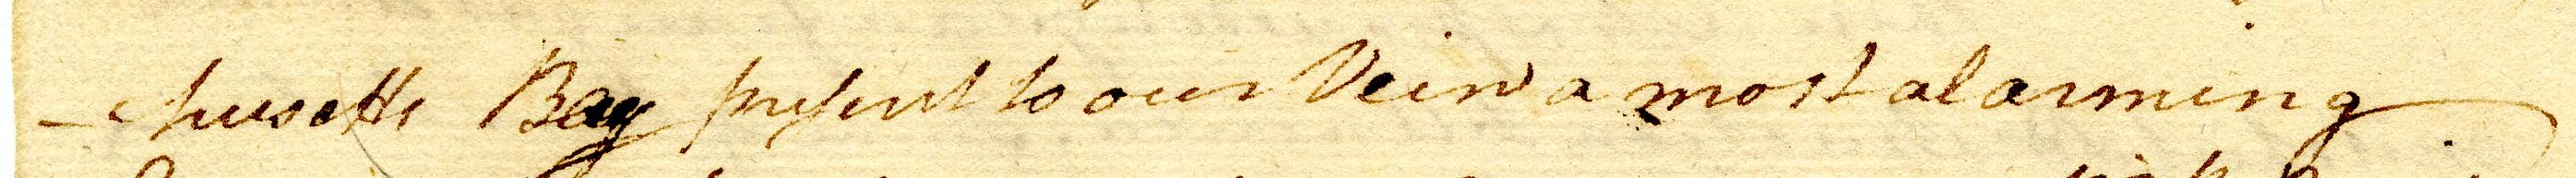-chusetts Bay present to our Vein a most alarming
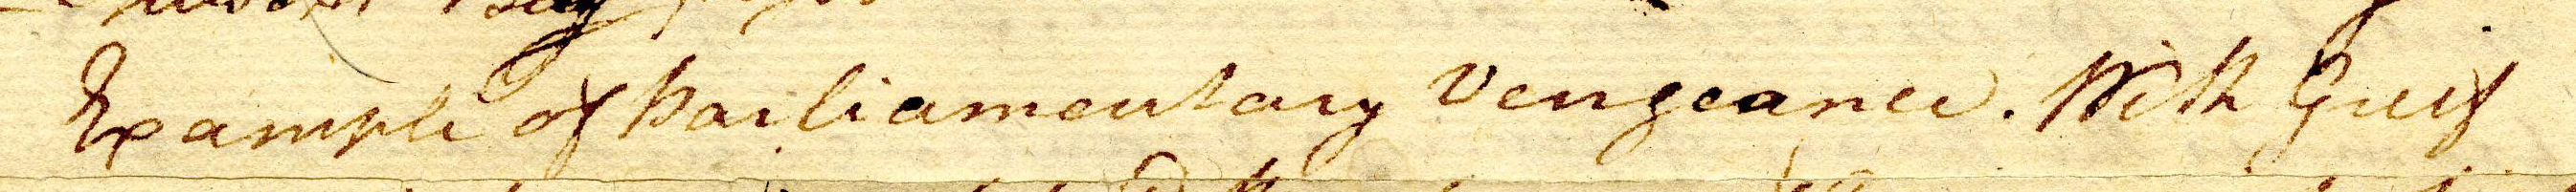Example of Parliamentary Vengeance. With Greif
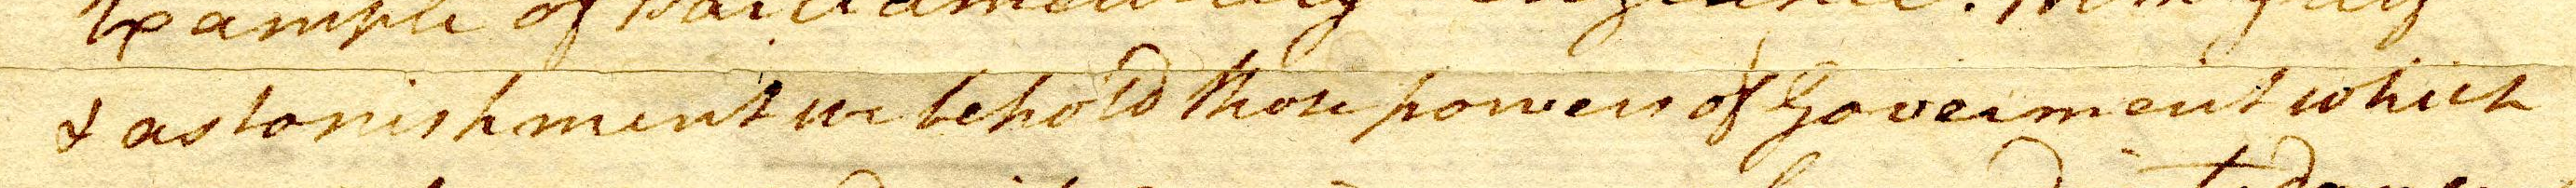& astonishment we behold those powers of Goverment which
